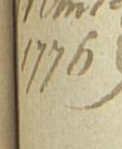1776
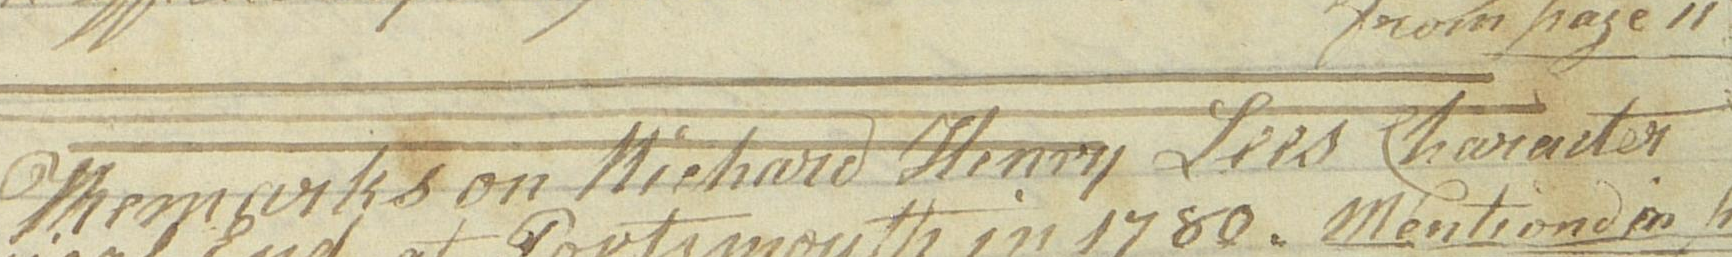Remarks on Diehard Henry Lees Character
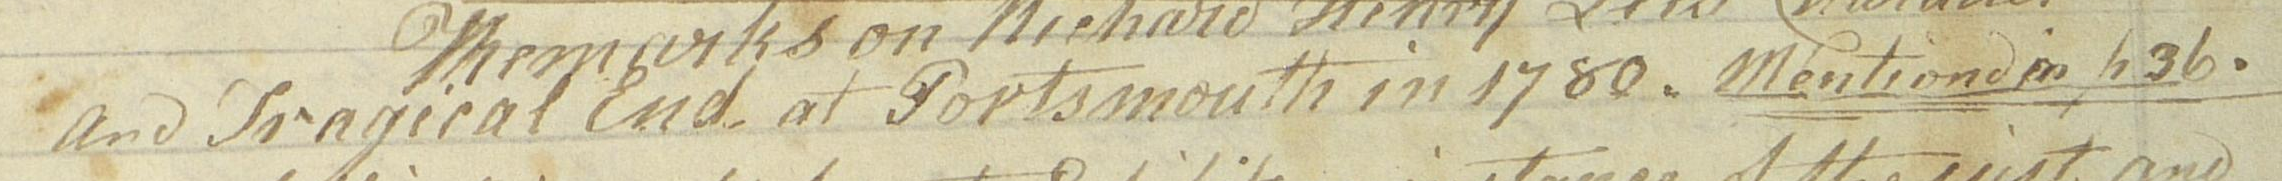and Tragical End at Portsmouth in 1780. Mentiond in p 36.
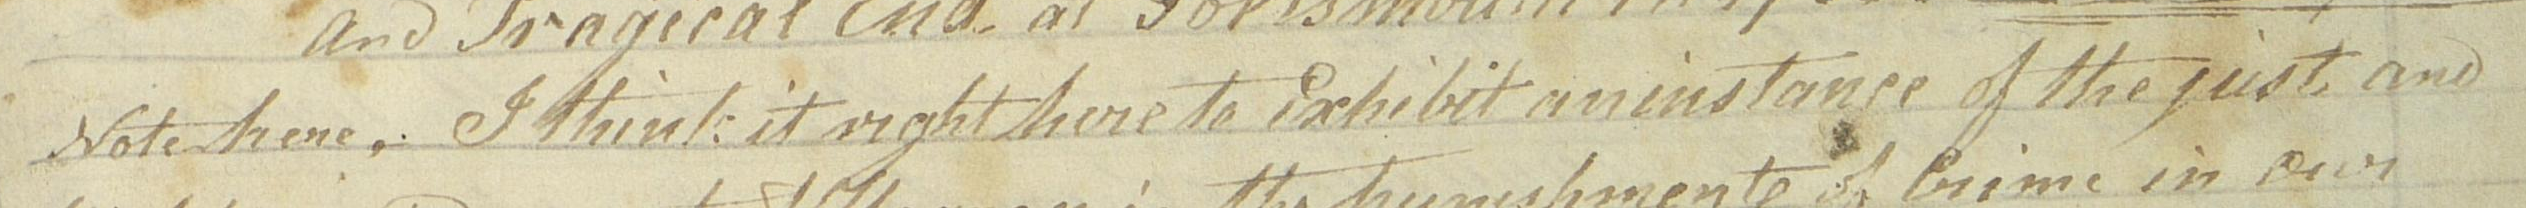Note here. I think it right here to Exhibit an instance of the just and
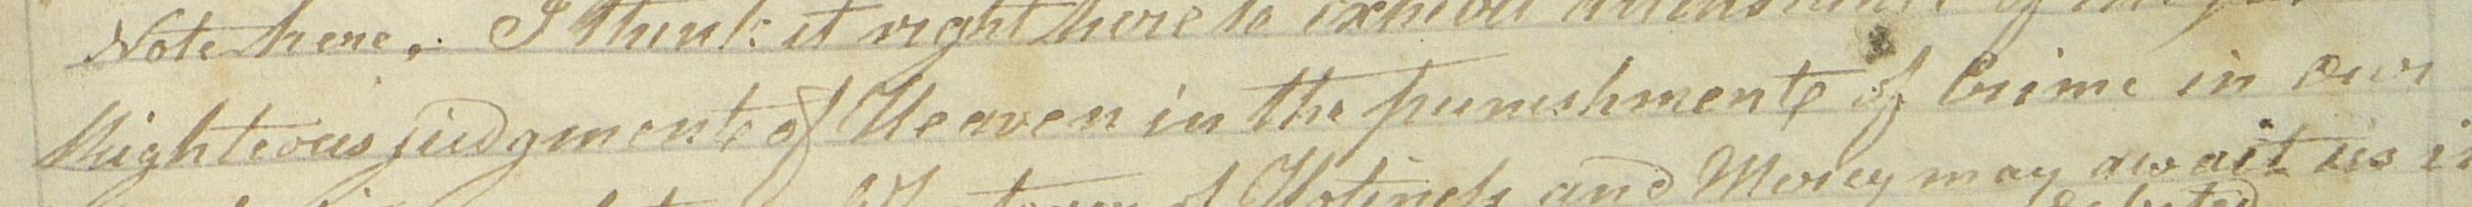Righteous judgment of Heaven in the punishments of Crime in our
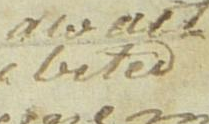Ex beted
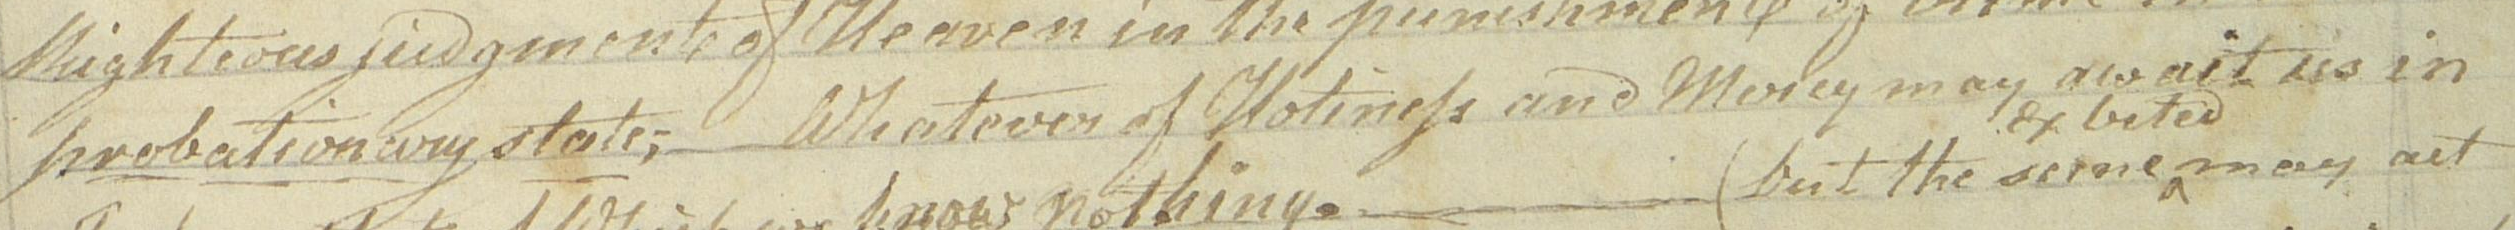probationary state; Whatever of Hotiness and Mercy may await us in
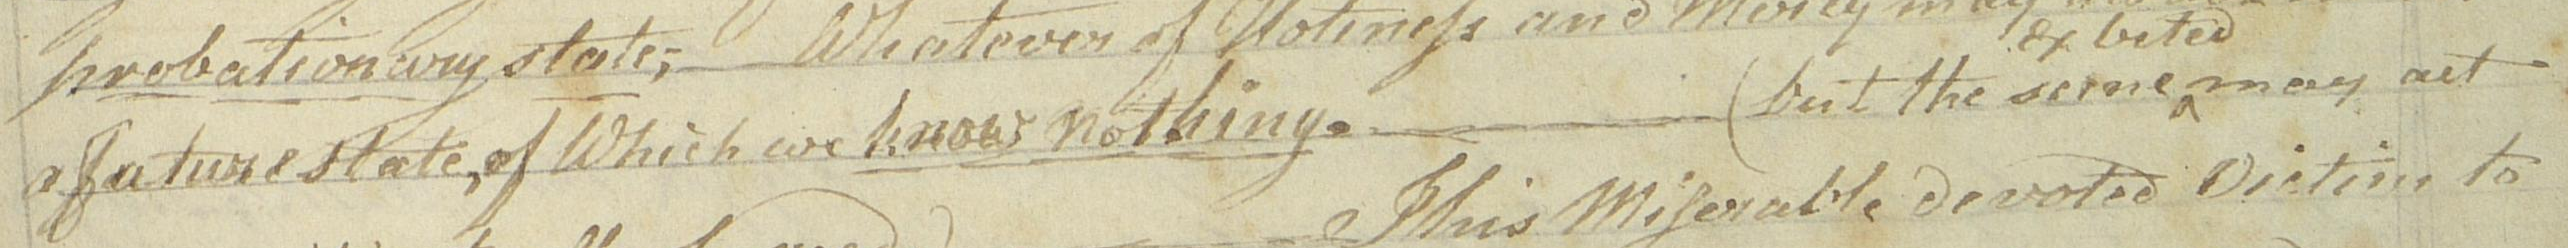a future state, of Which we know Nothing. (but the some ^ may act
